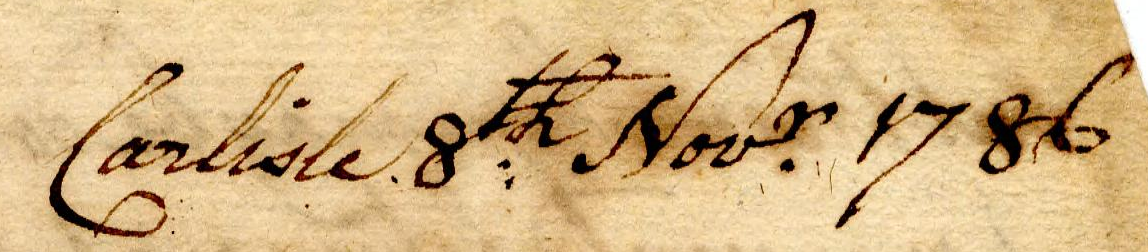Carlisle 8^th. Nov^r. 1786
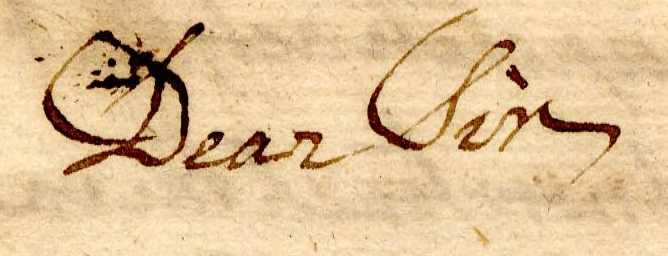Dear Sir
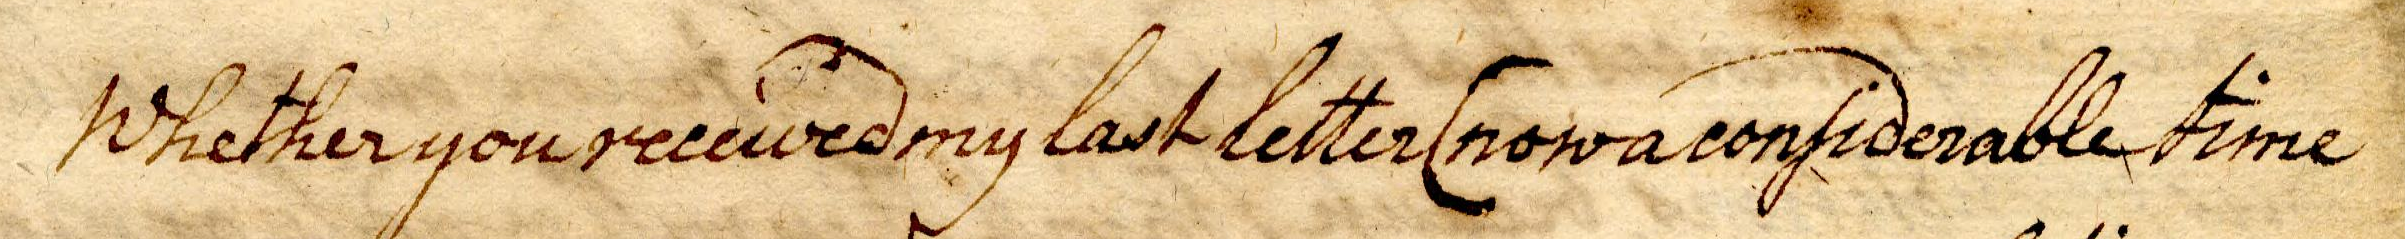Whether you received my last letter (now a considerable time
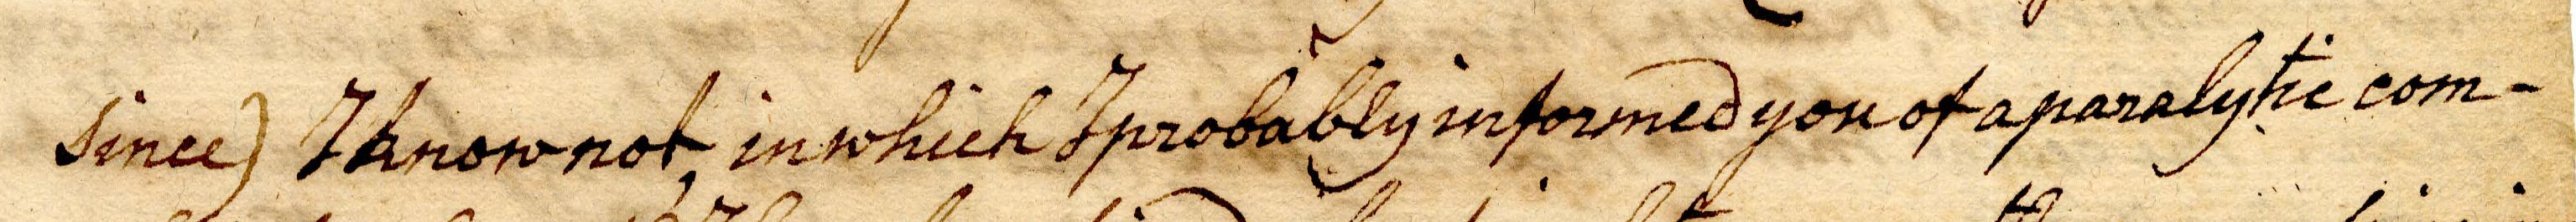since) I know not, in which I probably informed you of a paralytic com-
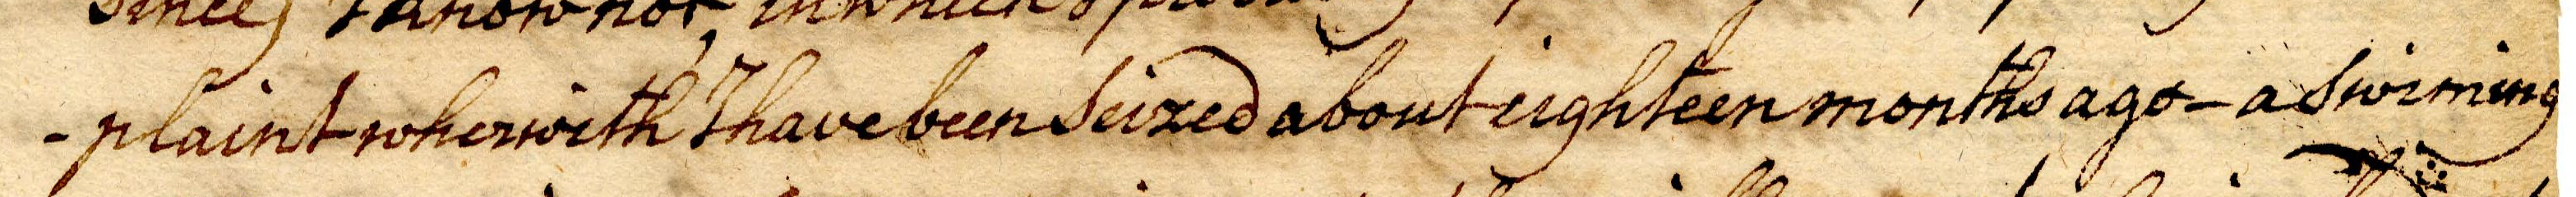-plaint wherwith I have been Seized about eighteen months ago- a Swiming
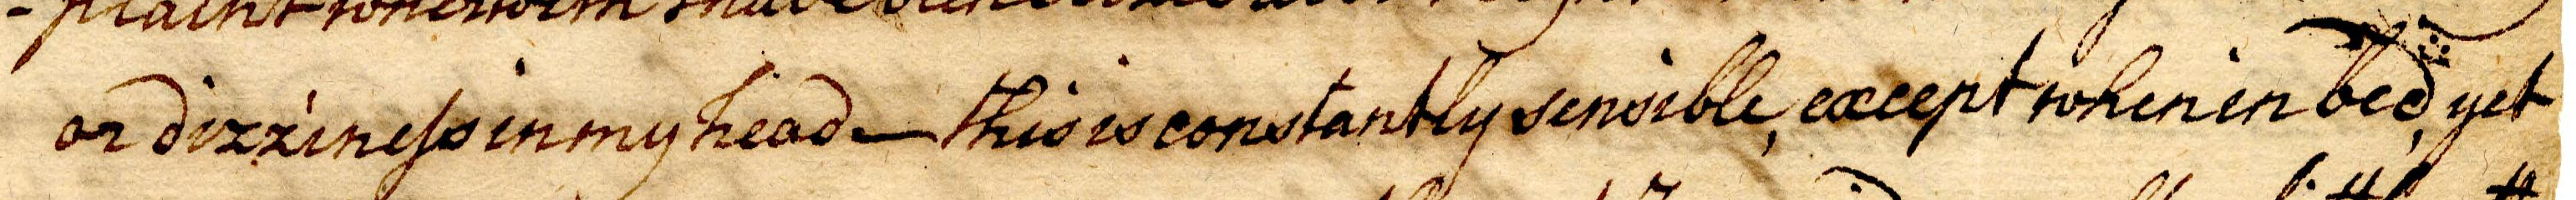or dizziness in my head- This is constantly sensible, except when in bed, yet
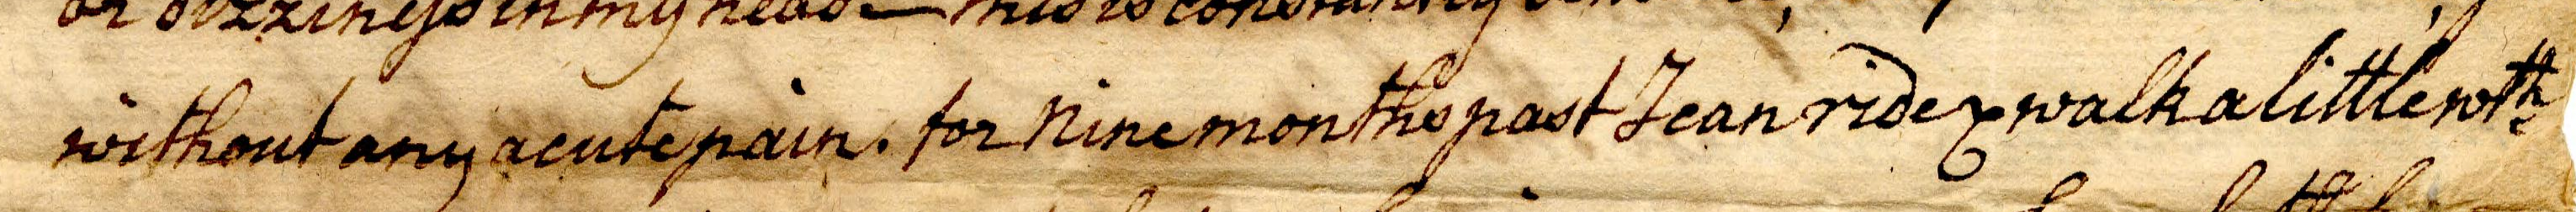without any acute pain. for nine months past I can ride, walk a little w^th.
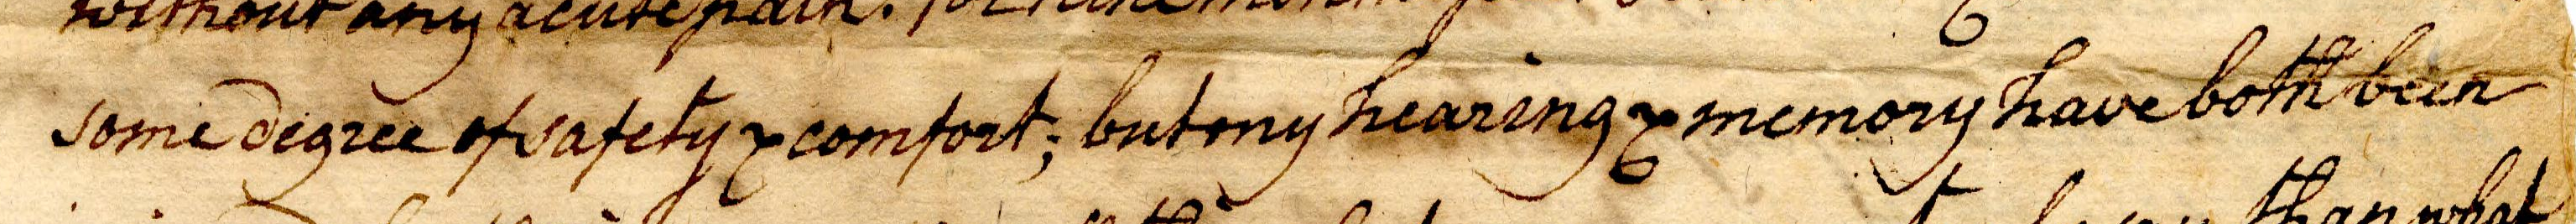some degree of safety & comfort; but my hearing & memory have both been
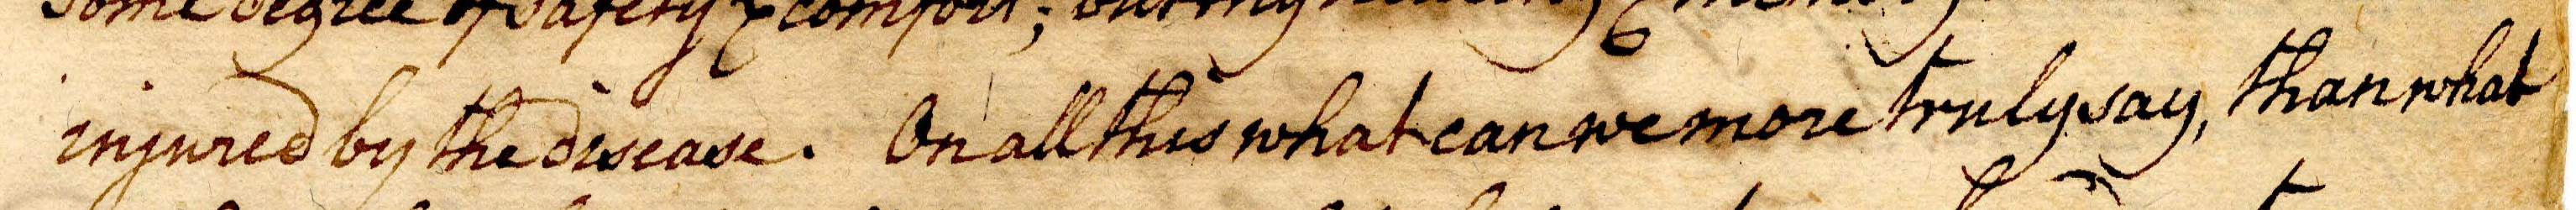injured by the disease. On all this what can we more truly say, than what
